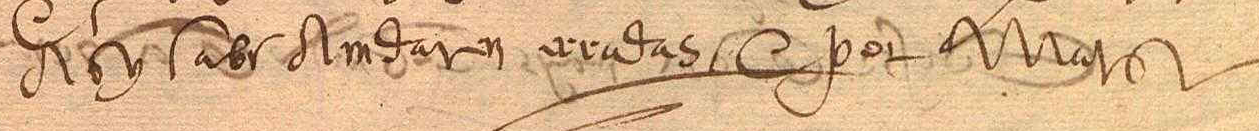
Asy sabe Amdarem erradas / e por Majs
